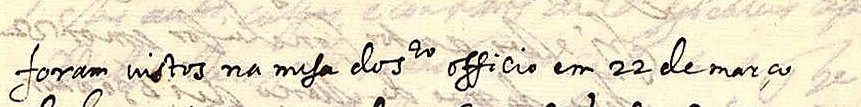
foram uistos na mesa do sto officio em 22 de março
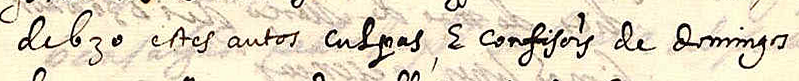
de 630 estes autos culpas, E confisoĩs de domingos
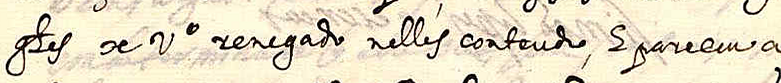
gl̄es xvo renegado nelles conteudo, E pareceu a
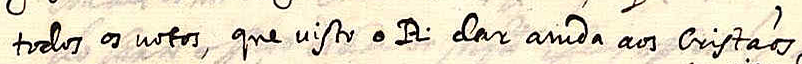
todos os uotos, que uisto o R. dar aiuda aos cristaõs
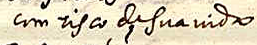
com risco de sua uida
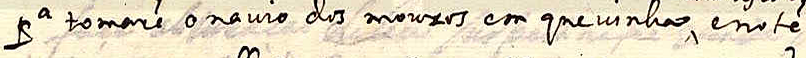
pa tomarē o nauio dos mouros em que uinha e no tē
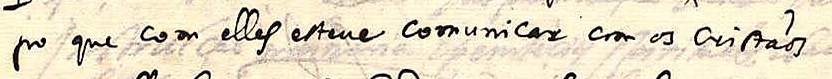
po que com elles esteue comunicar com os cristaõs
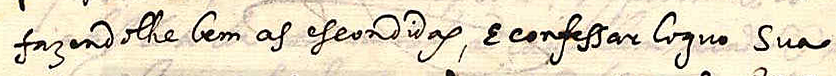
fazendolhe bem as escondidas, E confessar loguo sua
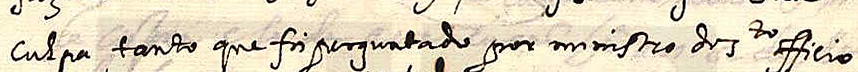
culpa tanto que foi perguntado por ministro do sto officio
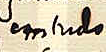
em tudo
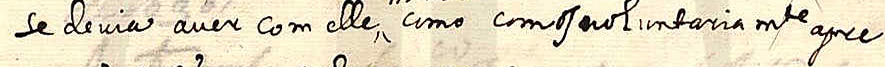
se deuia auer com elle como com os uoluntariam.te apre
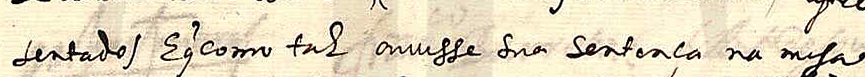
sentados E q̄ como tal ouuisse sua sentença na mesa
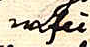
na feé
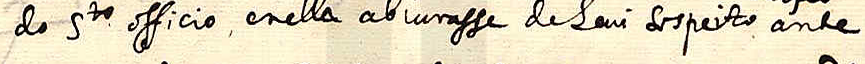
do s.to officio, e nella abiurasse de Leui sospeito ante
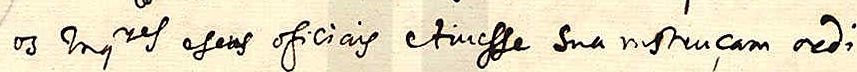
os Inqres e seus oficiais e tiuesse sua instruçam ordi
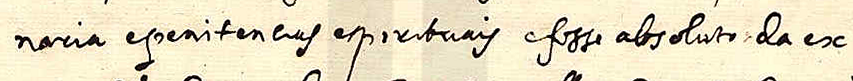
naria e penitencias espirituais e fosse absoluto da ex
